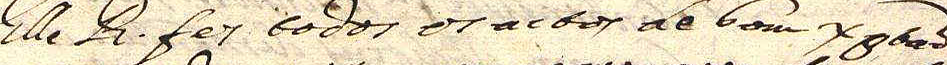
Elle R. fez todos os actos de bom xptaõ
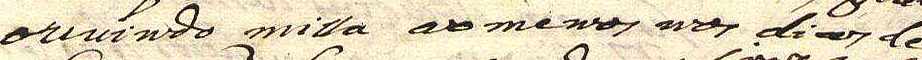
ouuindo missa ao menos aos dias de
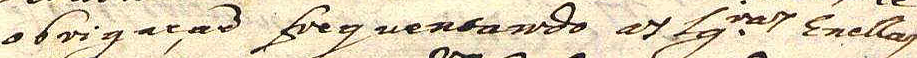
obrigaçaõ frequentando as Ig.ras E nellas
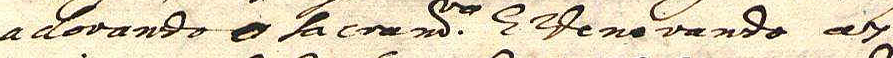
adorando o sacram.to E Venerando as
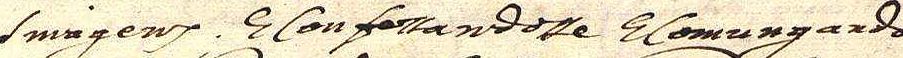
Imagens; E Confessandosse E Comungando
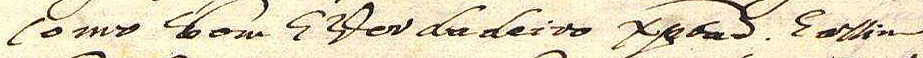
Como bom E Verdadeiro Xptaõ; E assim
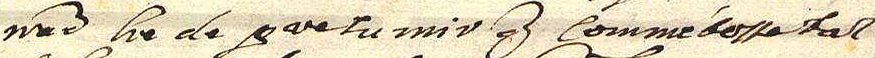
naõ he de prezumir q̄ Commetesse tal
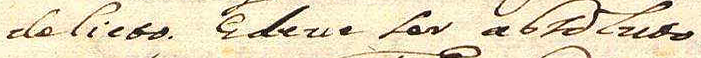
delicto; E deue ser absoluto.
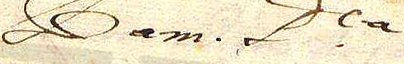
Tam. Pça
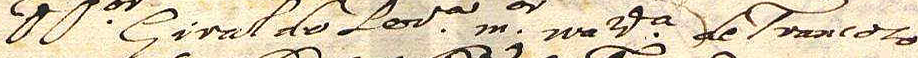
O D.or Giraldo Per.a m.or na V.a de Trancozo
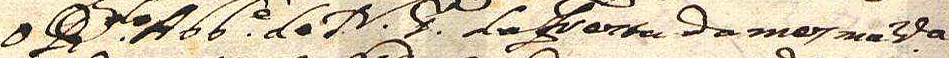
O Rdo. Abbe. de N. S.ra da Fresta da mesma V.a
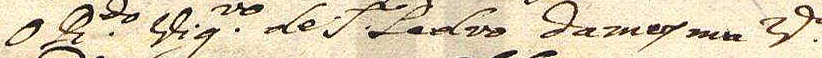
O Rdo. Vigro. de S. Pedro da mesma V.a
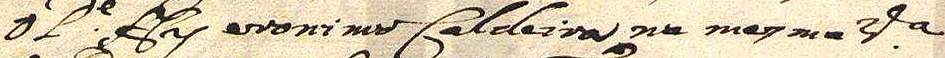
O Pe. Hyeronimo Caldeira na mesma V.a
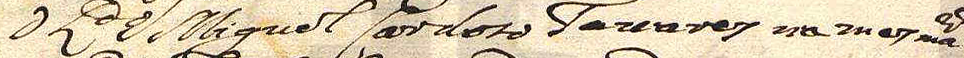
O Ldo Miguel Cardoso Tauares na mesma V.a
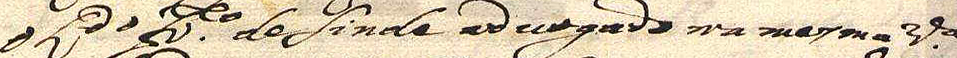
O Ldo Fr.co de Sinde aduogado na mesma V.a
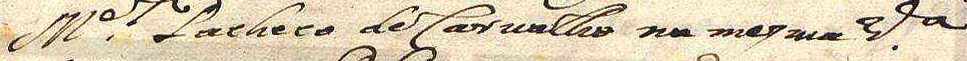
Mel. Pacheco de Carualho na mesma V.a
